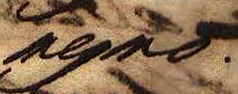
mesmo.
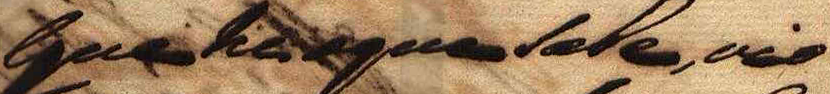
Que he o que sabe, vio
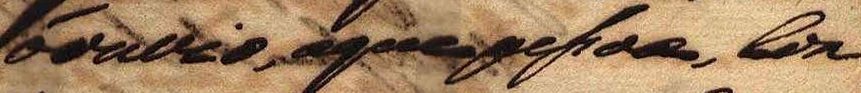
ou ouvio, a que pessoa, Con
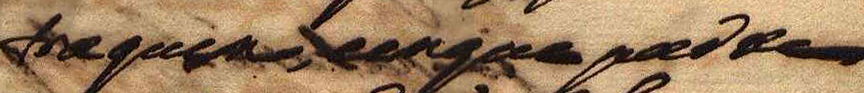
tra quem, e em que parte
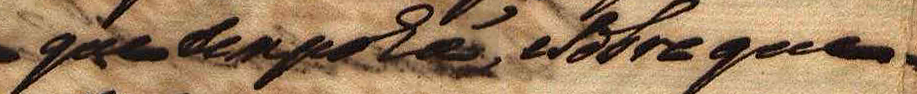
que tempo há, e sobre que
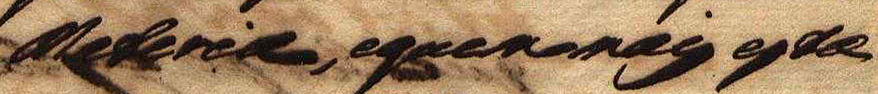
Materia, e quem mais esta
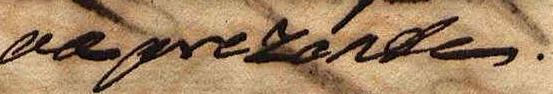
va prezente.
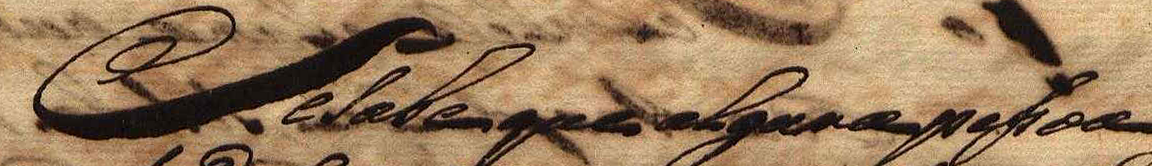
Se sabe que alguma pessoa
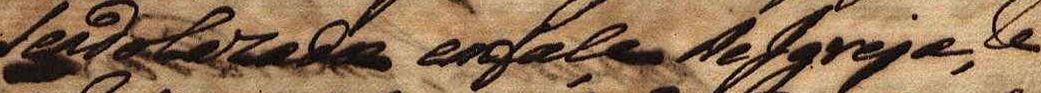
sendo Cazada em façe de Igreja, Re
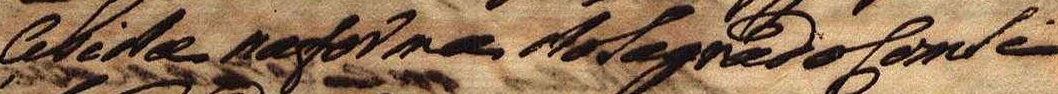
çebida na forma do Sagrado Comse
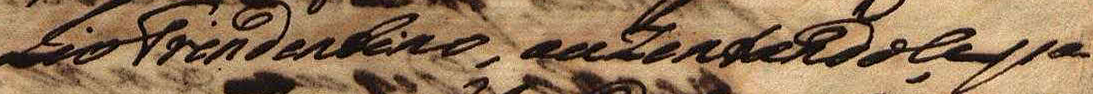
Lio Tridentino, auzentandoçe pa
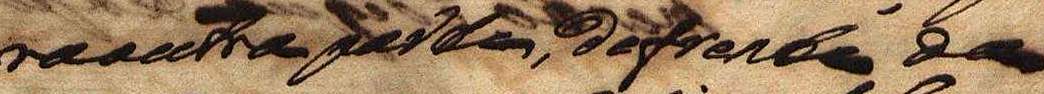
ra outra parte, de frente da
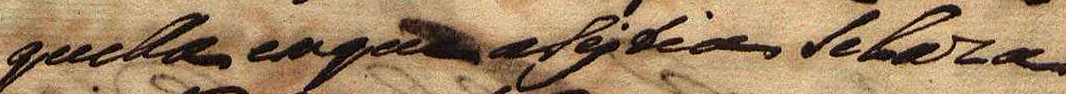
quella em que asistia se Caza
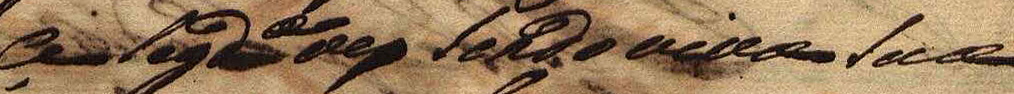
çe segda ves sendo vivo sua
